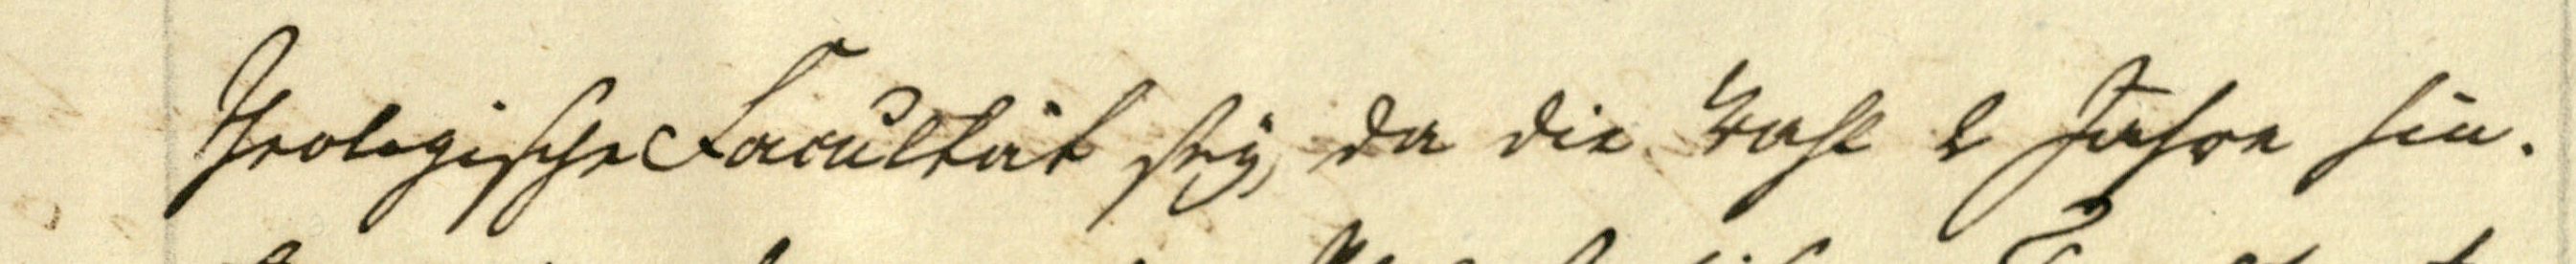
Theologische Facultät seÿ, da die Wahl 2 Jahre hin¬
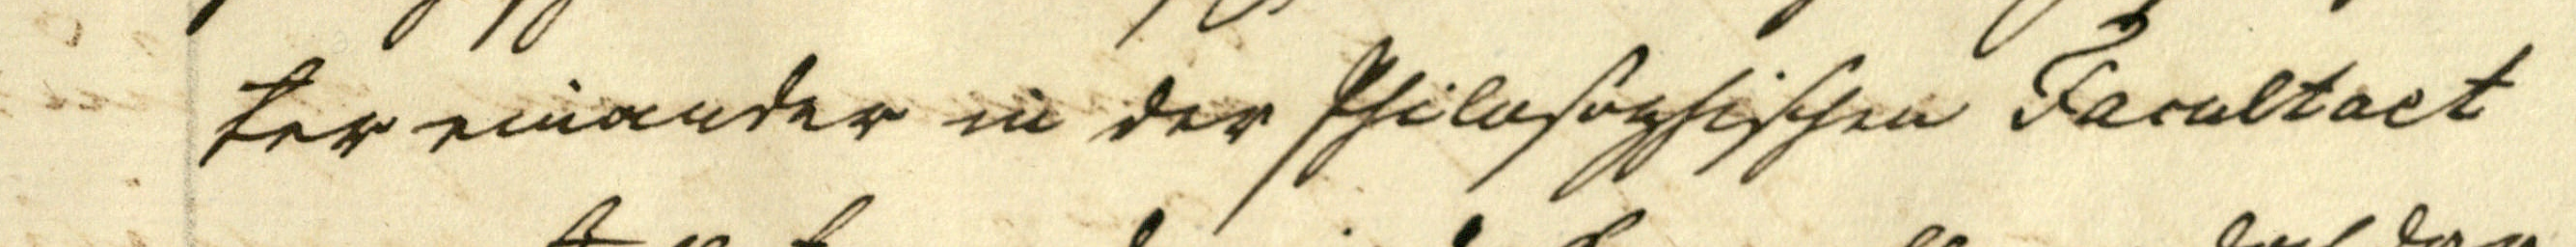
ter einander in der Philosophischen Facultaet
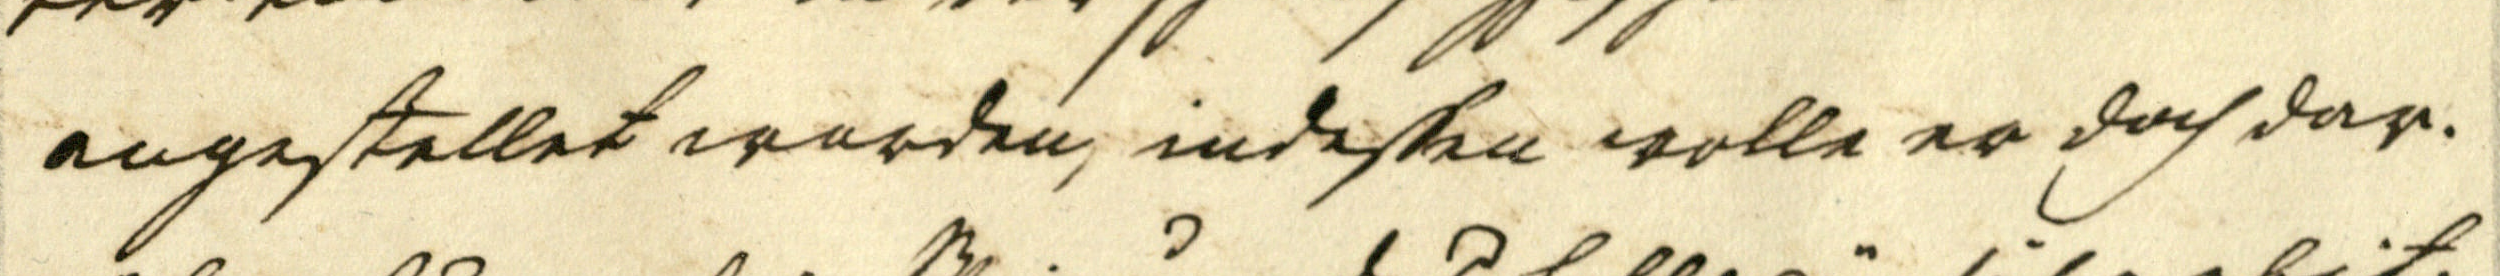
angestellet worden, indessen wolle er doch dar¬
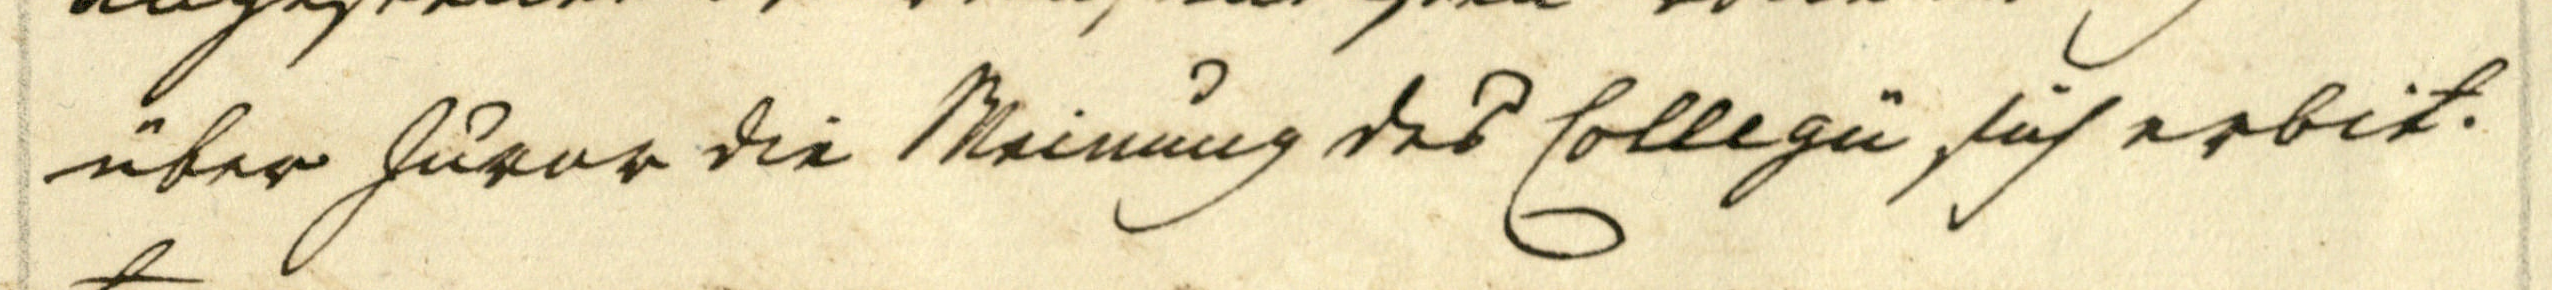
über zuvor die Meinung des Collegii sich erbit¬
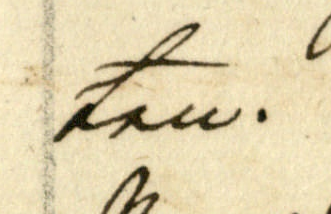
ten.
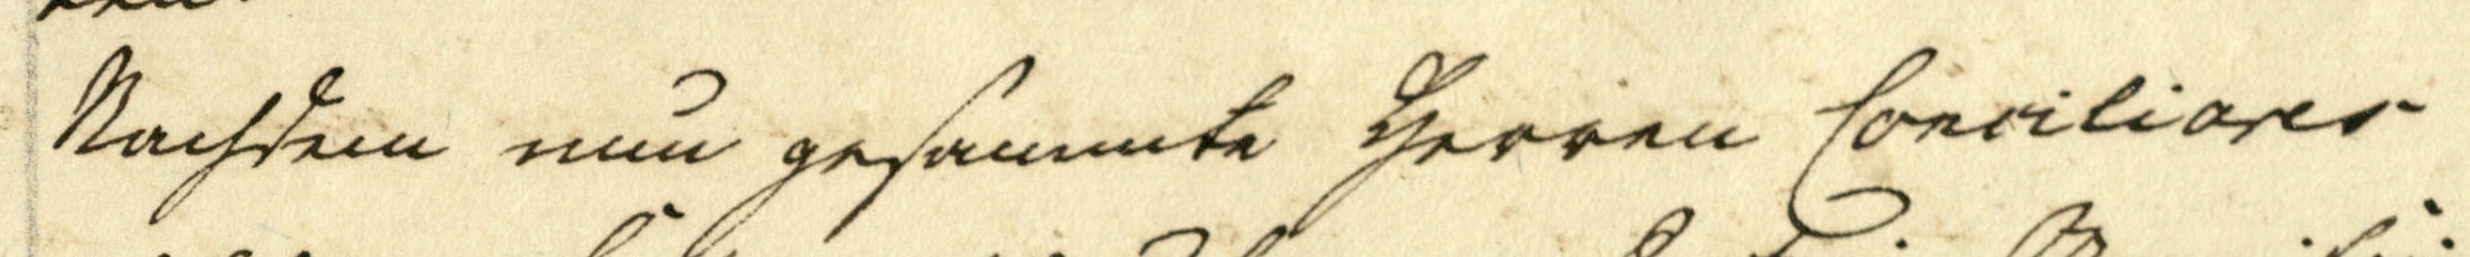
Nachdem nun gesammte Herren Conciliares
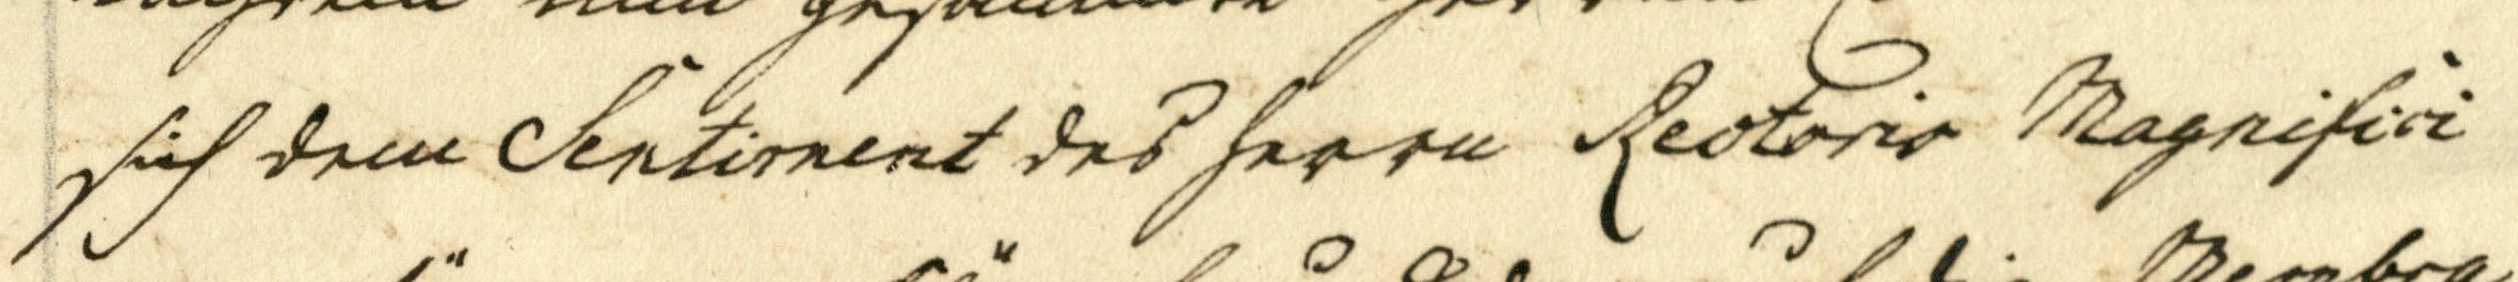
sich dem Sentiment des Herrn Rectoris Magnifici
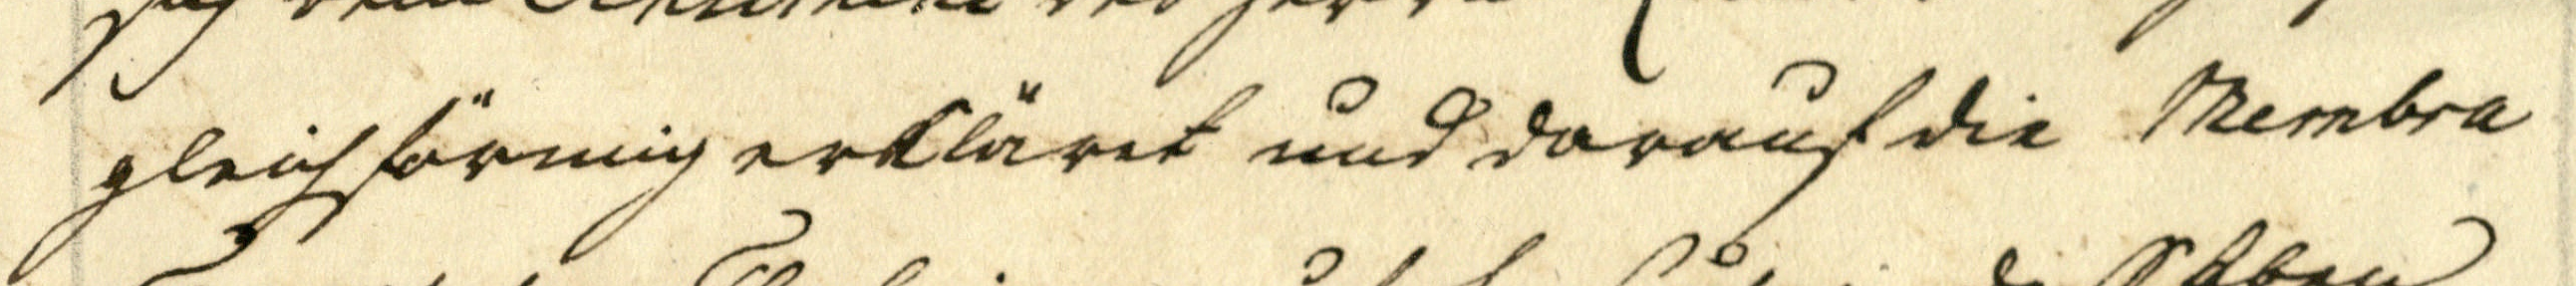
gleichförmig erkläret und darauf die Membra
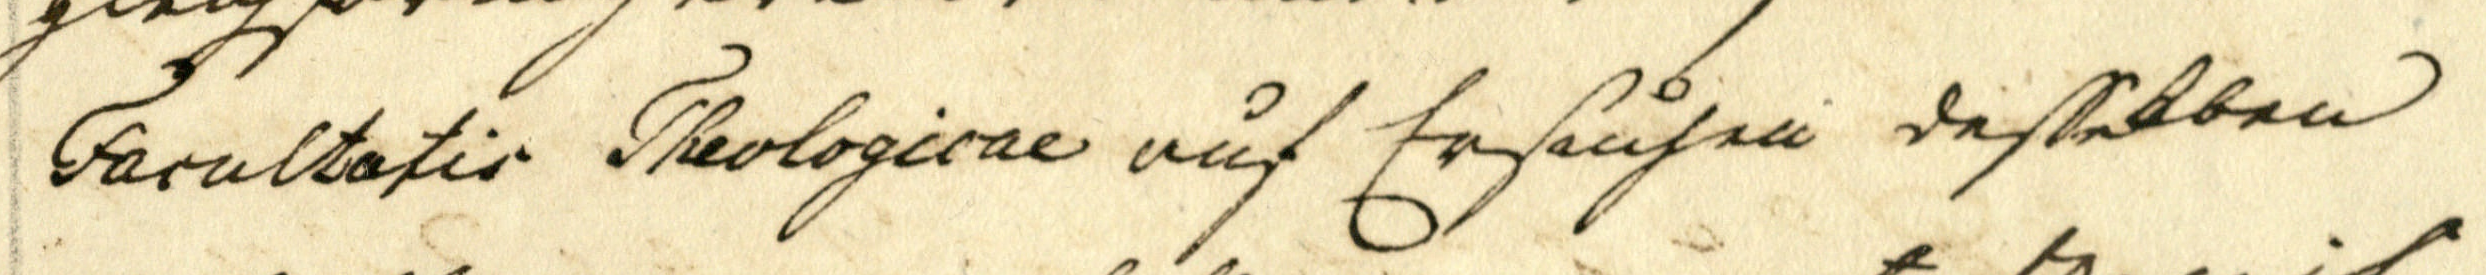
Facultatis Theologicae auf Ersuchen desselben
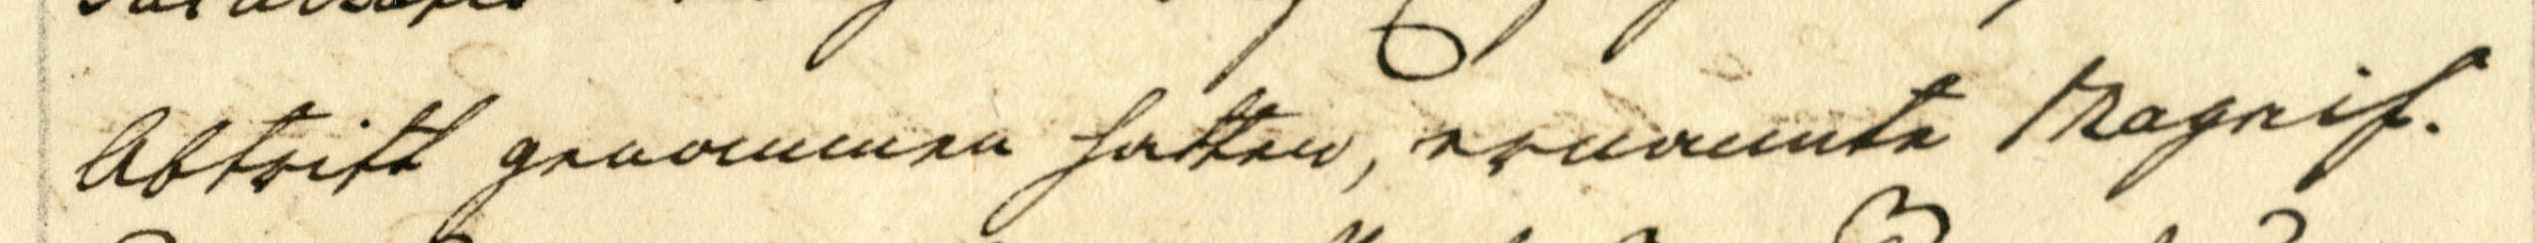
Abtritt genommen hatten, ernannte Magnif.
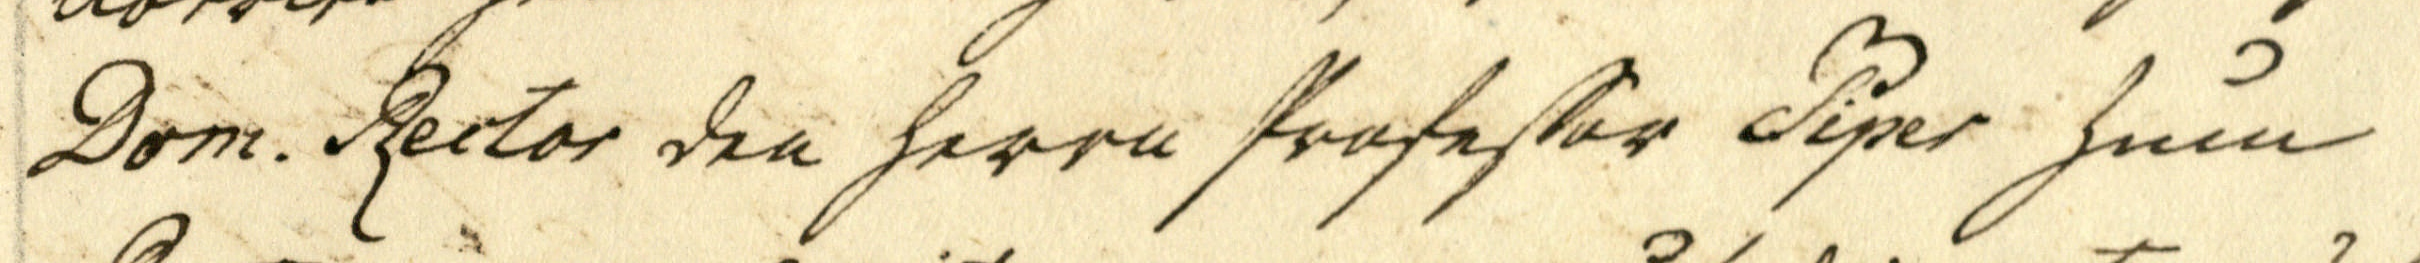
Dom. Rector den Herrn Professor Piper zum
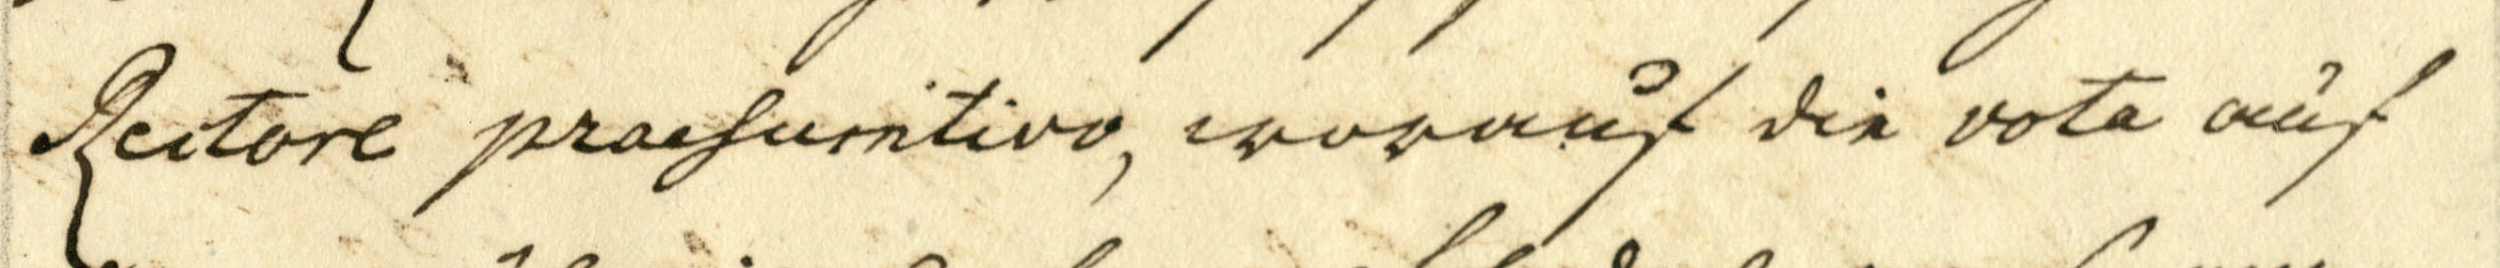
Rectore praesumtivo, worauf die vota auf
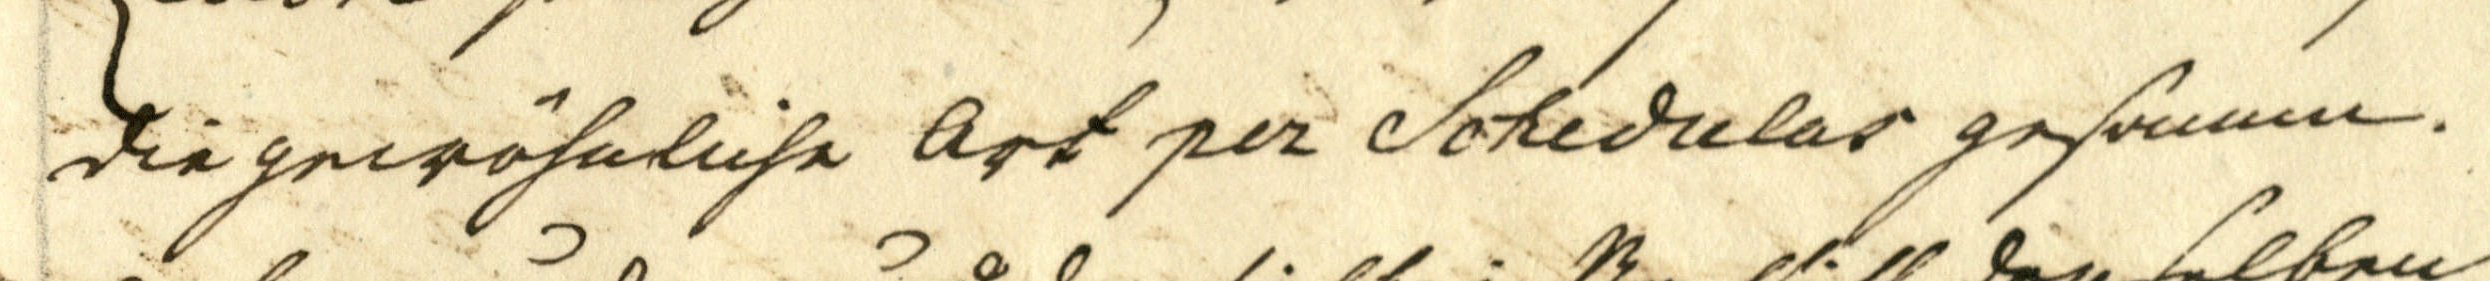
die gewöhnliche Art per Schedulas gesamm¬
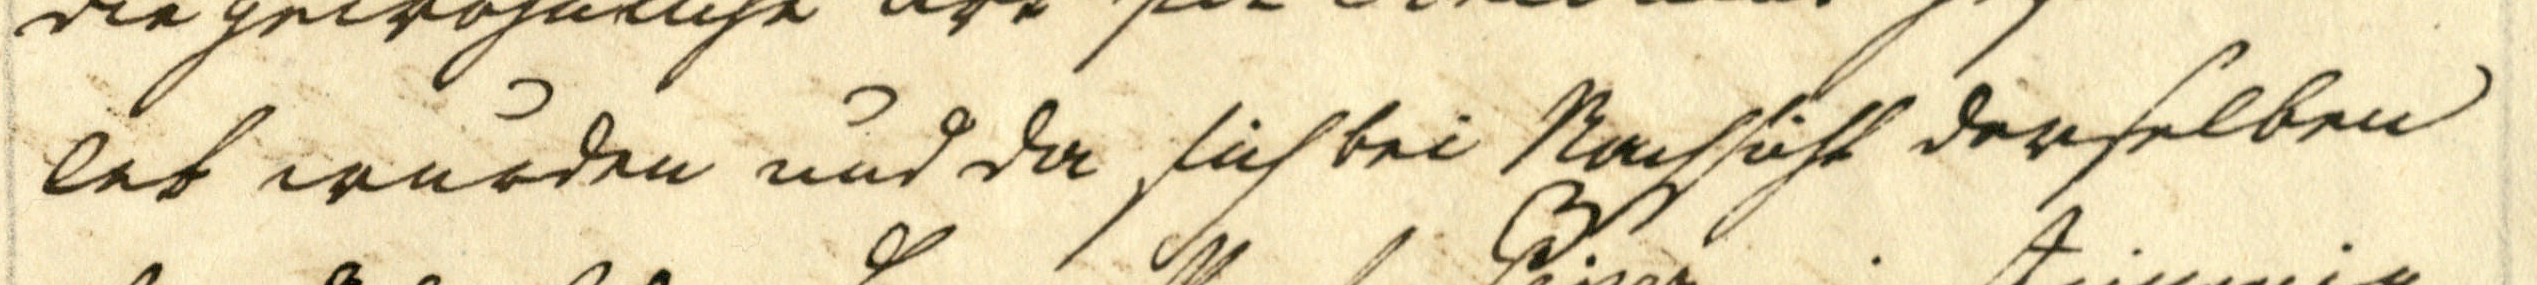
let wurden und da sich bei Nachsicht derselben
